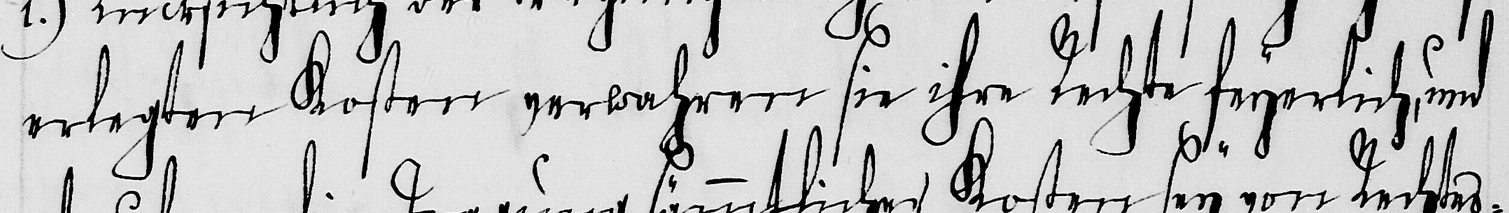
ferlegten Kosten verwahren sie ihre Rechte feyerlich, und
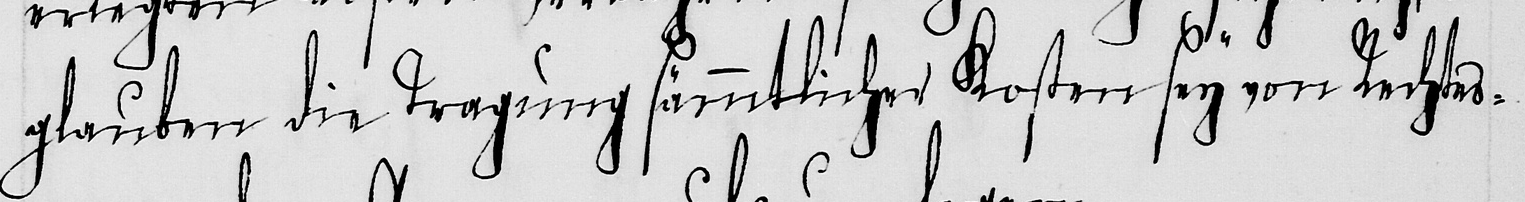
glauben die Tragung sämmtlicher Kosten sey von Rechtes¬
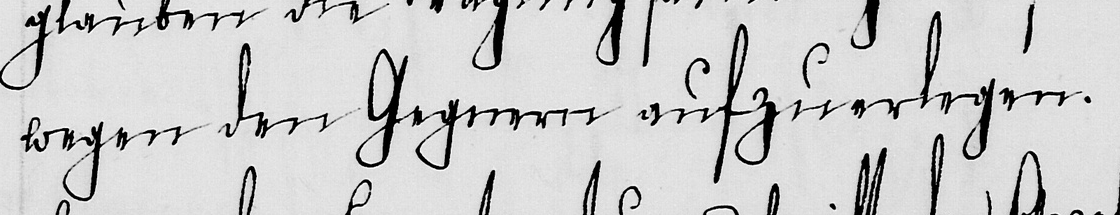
wegen den Gegnern aufzuerlegen.
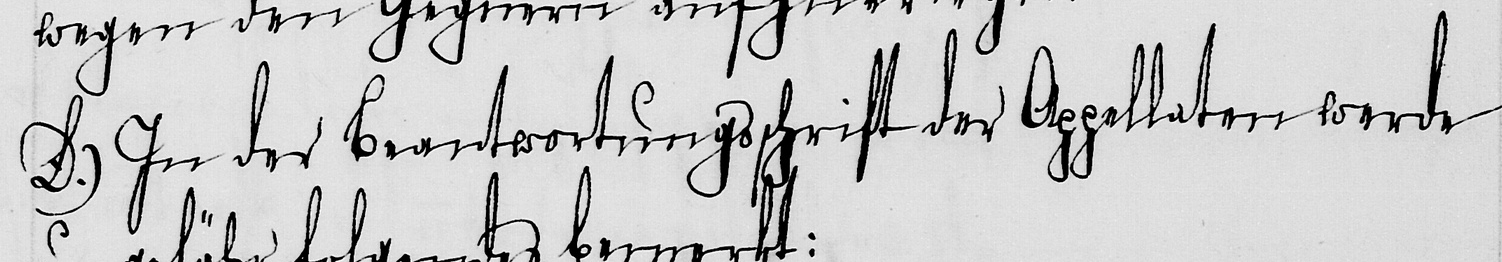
D.) In der Beantwortungsschrift der Appelaten werde
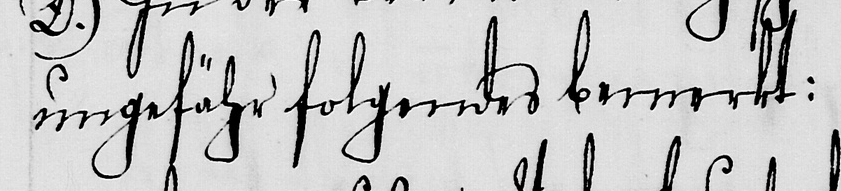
ungefähr folgendes bemerkt:
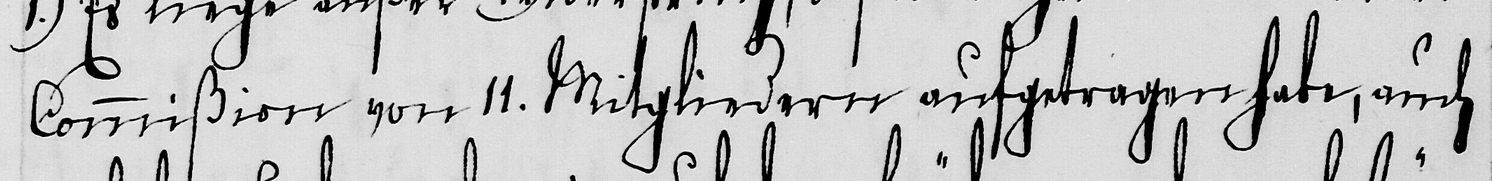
Commißion von 11. Mitgliedern aufgetragen habe, auch
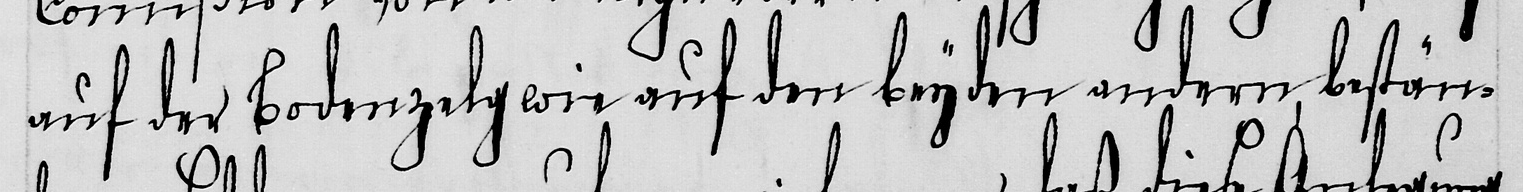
auf der Bodenzelg wie auf den bey den andern bestän¬
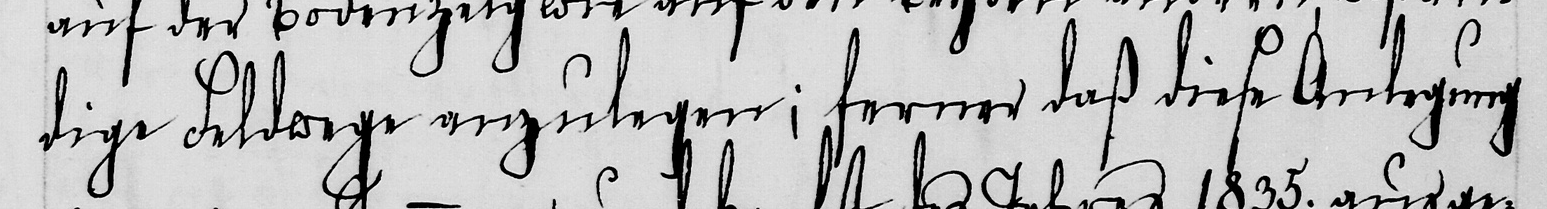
dige Feldwege anzulegen; ferner daß diese Anlegung
